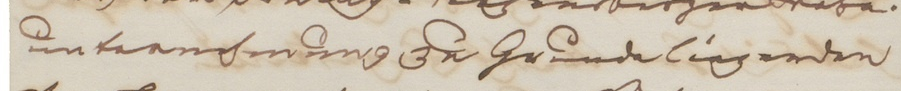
unternehmung zu Grunde liegenden
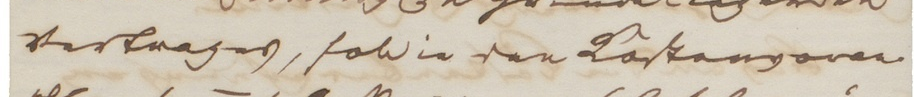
Vertrages, sowie den Kostenvoran-
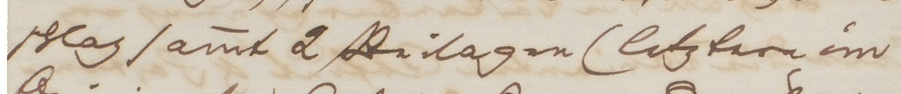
schlag sammt 2 Beilagen (letztere im
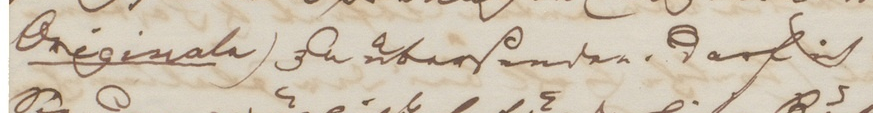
Originale) zu übersenden. Darf ich
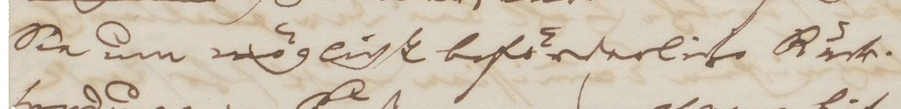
Sie um möglichst beförderliche Rück-
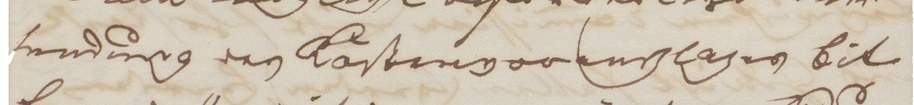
sendung des Kostenvoranschlages bit-
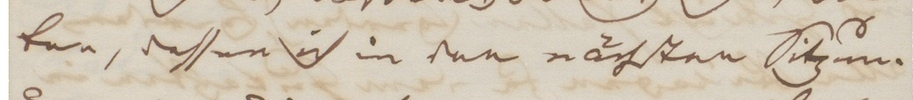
ten, dessen ich in den nächsten Sitzun-
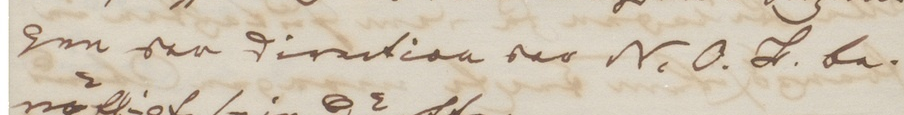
gen der Direction der N.O.B. be-
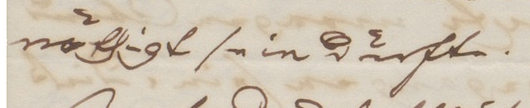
nöthigt sein dürfte.
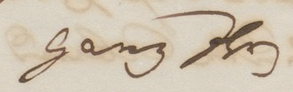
Ganz Ihr
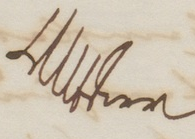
Escher
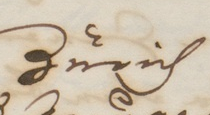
Zürich
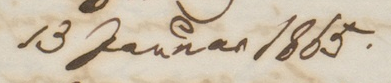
13 Januar 1865.
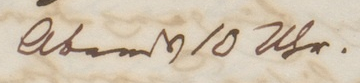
Abends 10 Uhr.
